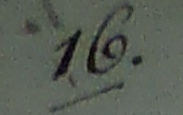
16.
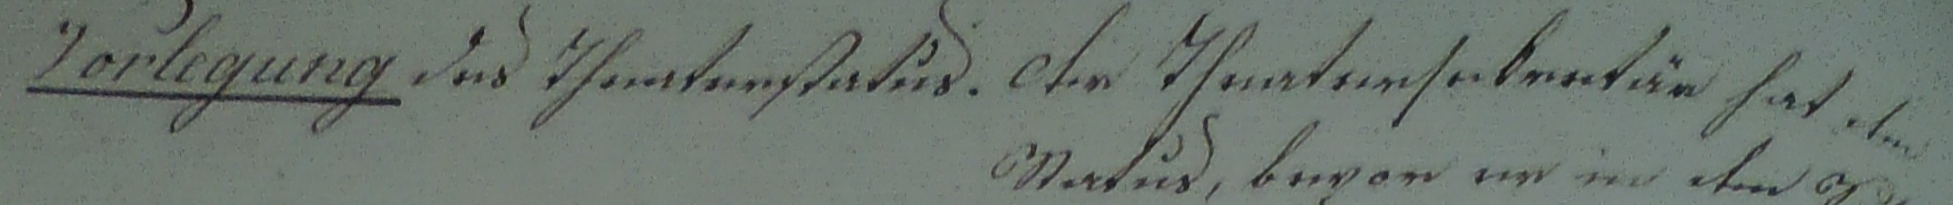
Vorlegung des Theaterstatus. Der Theatersekretär hat den
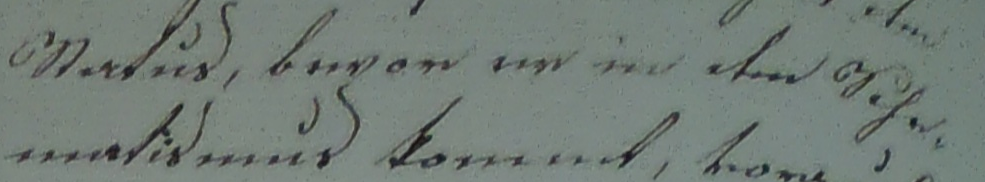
Status, bevor er in den Sche¬
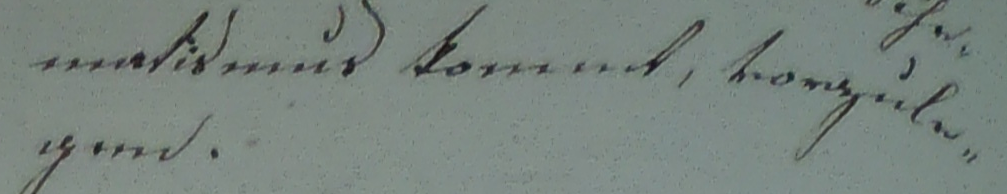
matismus kommt, vorzule¬
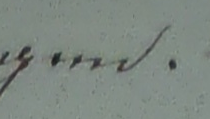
gen.
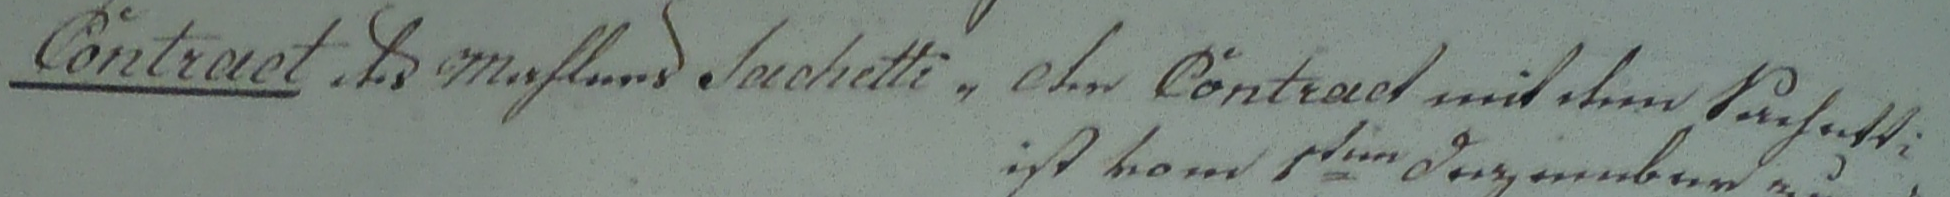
Contract des Mahlers Sachetti ,, Der Contract mit dem Sachetti
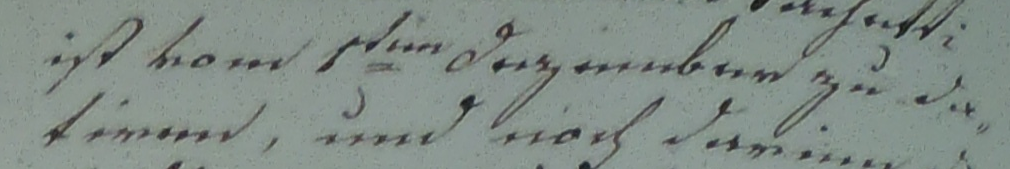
ist vom 1te͇n Dezember zu da¬
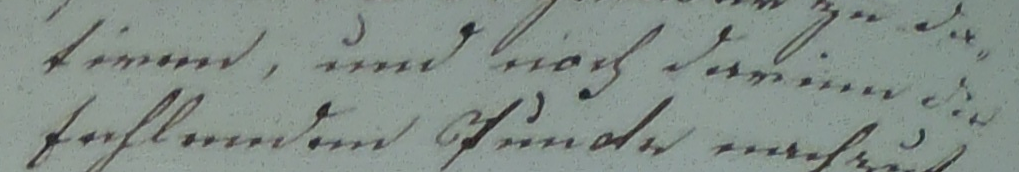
tiren, und noch darinn die
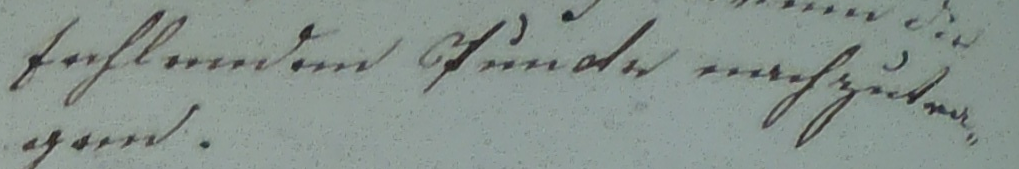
fehlenden Funde nachzutra¬
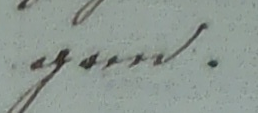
gen.
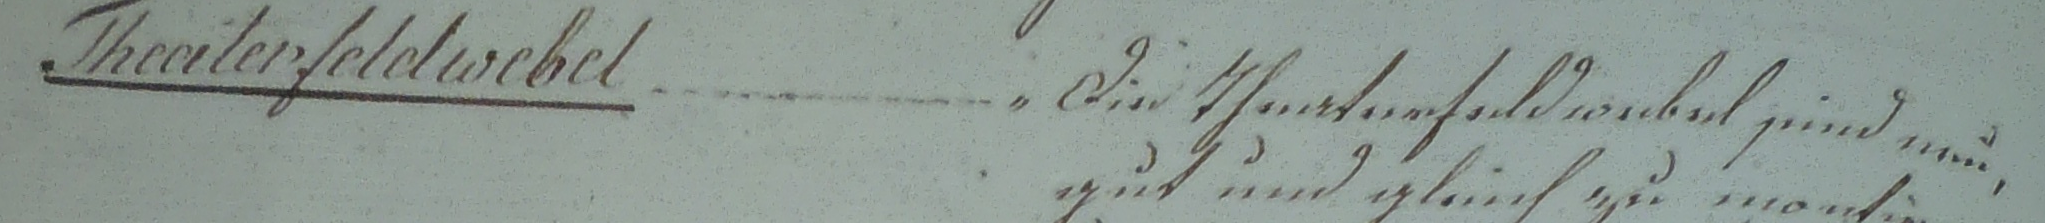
Theaterfeldwebel ………….. ,, Die Theaterfeldwebel sind neu,
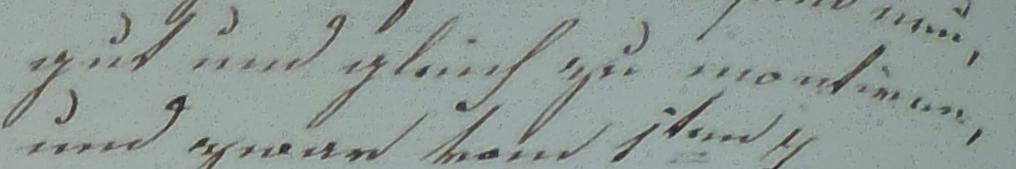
gut und gleich zu montiren,
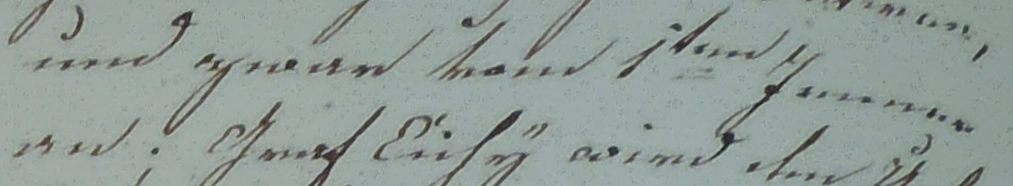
und zwar vom 1te͇n Jenner
